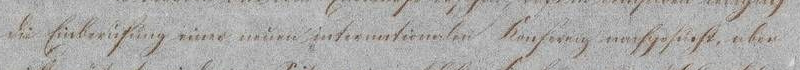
die Einberufung einer neuen internationalen Konferenz nachgesucht, aber
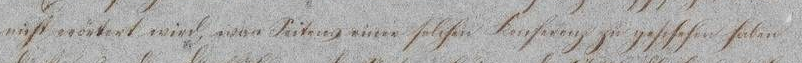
nicht erörtert wird, was Seitens einer solchen Konferenz zu geschehen haben
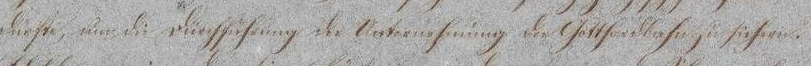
dürfte, um die Durchführung der Unternehmung der Gotthardbahn zu sichern.
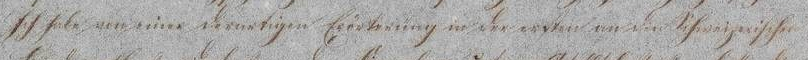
Ich habe von einer derartigen Erörterung in der ersten an den Schweizerischen
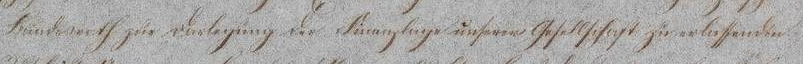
Bundesrath zur Darlegung der Finanzlage unserer Gesellschaft zu erlassenden
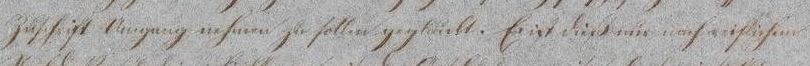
Zuschrift Umgang nehmen zu sollen geglaubt. Es ist dieß nur nach reiflichem
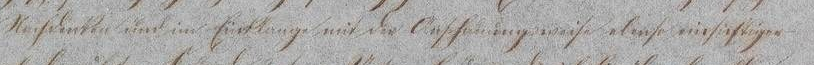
Nachdenken und im Einklange mit der Anschauungsweise ebenso einsichtiger
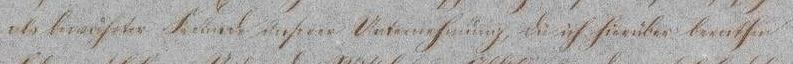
als bewährter Freunde unserer Unternehmung, die ich hierüber berathen
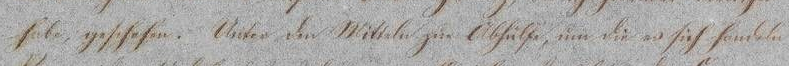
habe, geschehen. Unter den Mitteln zur Abhülfe, um die es sich handeln
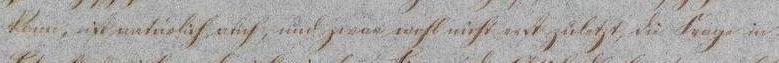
kann, ist natürlich auch, und zwar wohl nicht erst zuletzt, die Frage in
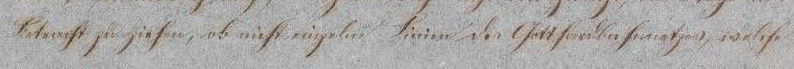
Betracht zu ziehen, ob nicht einzelne Linien des Gotthardbahnnetzes, welche
